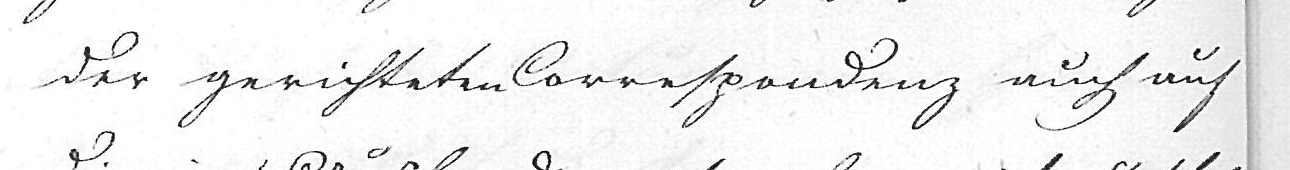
der gerichteten Correspondenz auch auf
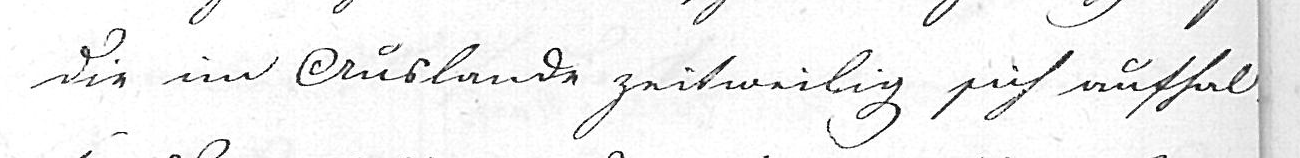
die im Auslande zeitweilig sich aufhal-
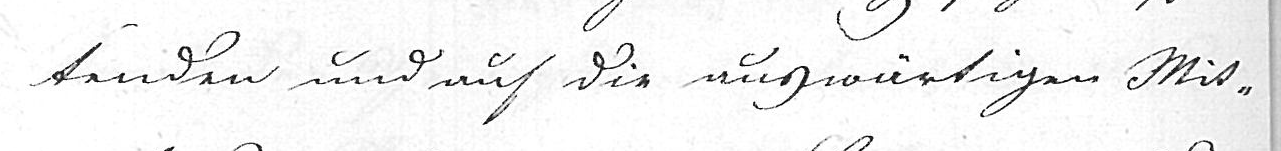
tenden und auf die auswärtigen Mit-
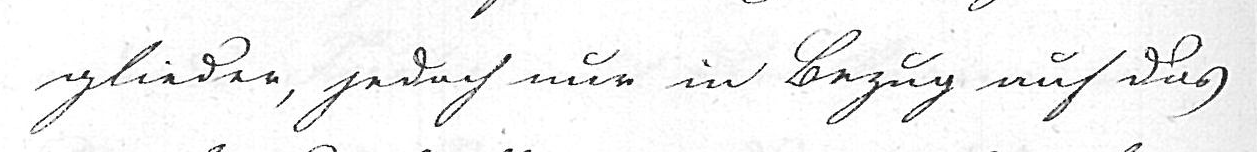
glieder, jedoch nur in Bezug auf das
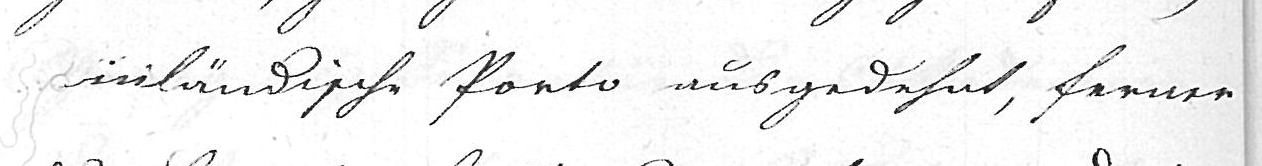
inländische Poeto ausgedehnt, ferner
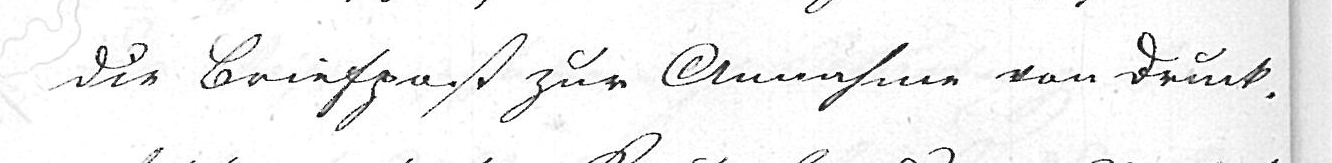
die Briefpost zur Annahme von Druck-
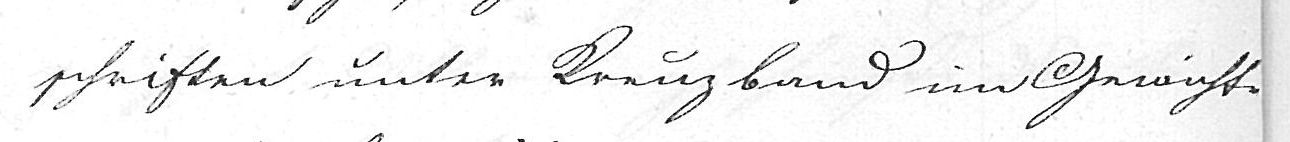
schriften unter Kreuzband im Gewichte
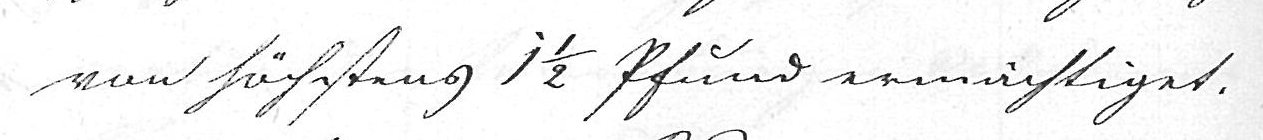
von höchstens 1 1/2 Pfund ermächtiget.
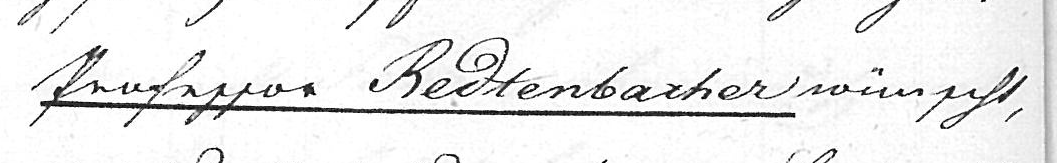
Professor Redtenbacher wünscht,
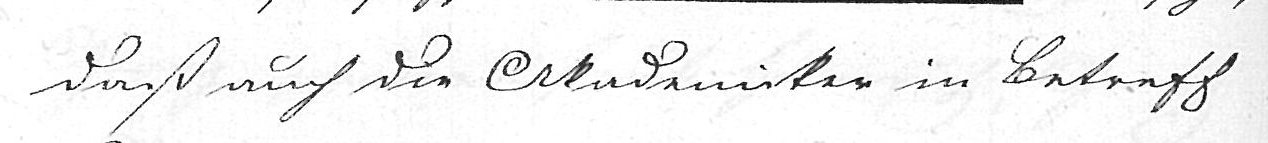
daß auch die Akademiker in Betreff
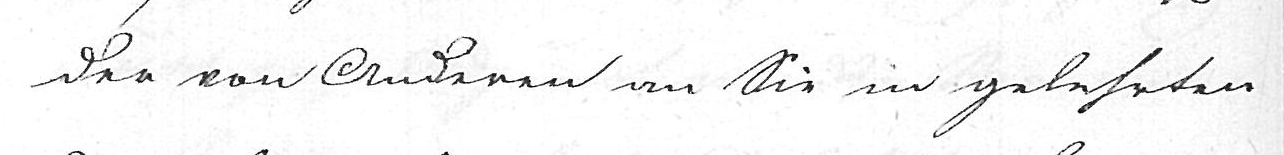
der von Anderen an Sie in gelehrten
